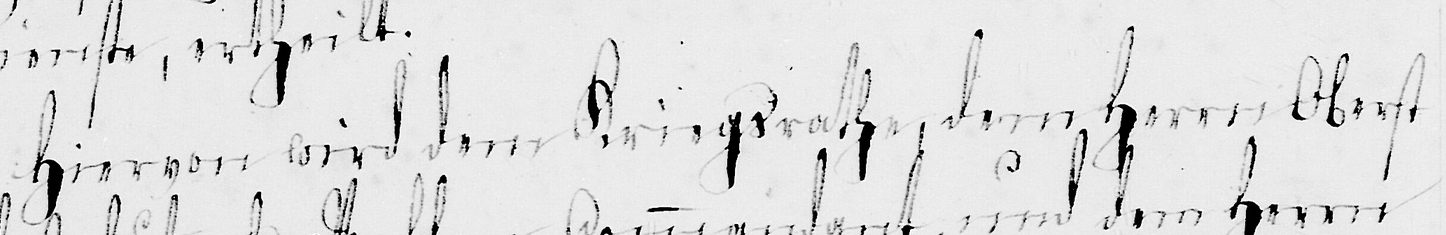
Hiervon wird dem Kriegsrathe, dem Herrn Oberst
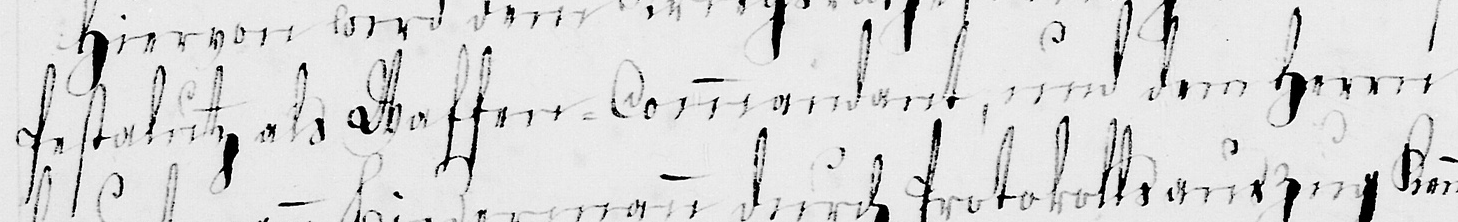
Pestalutz als Waffen-Commandant, und dem Herrn
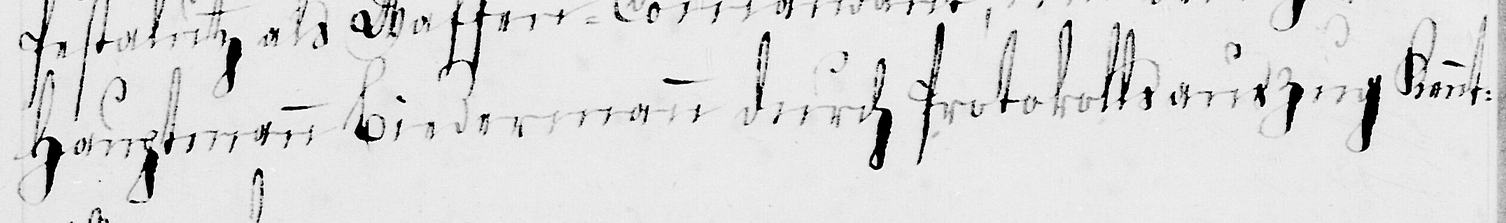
Hauptmann Biedermann durch Protokollsauszug Kennt¬
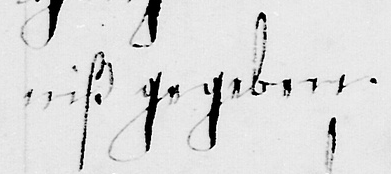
niß gegeben.
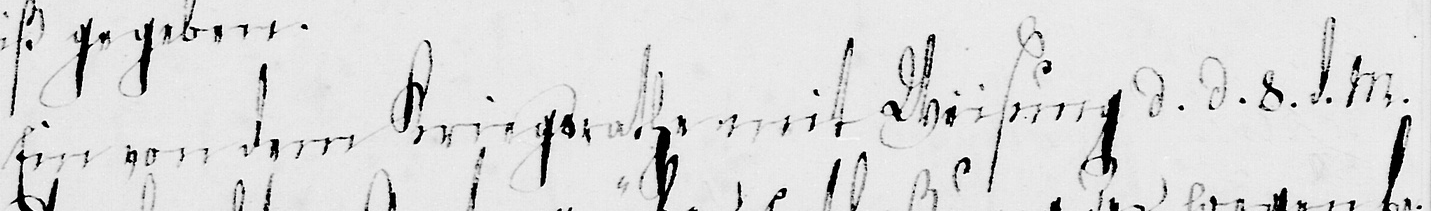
Ein von dem Kriegsrathe mit Weisung d. d. 8. d. M.
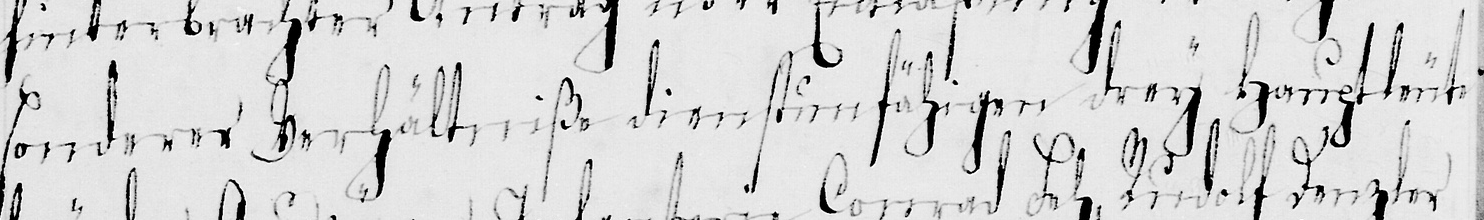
sonderer Verhältniße dienstunfähigen drey Hauptleute
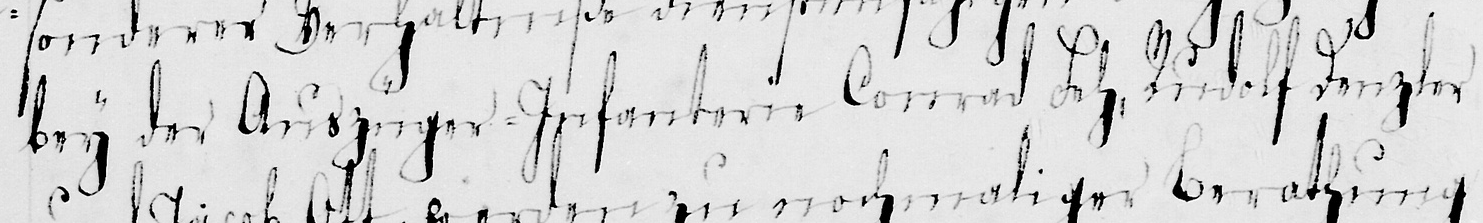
bey der Auszüger-Infanterie Conrad Feh, Rudolf Denzler
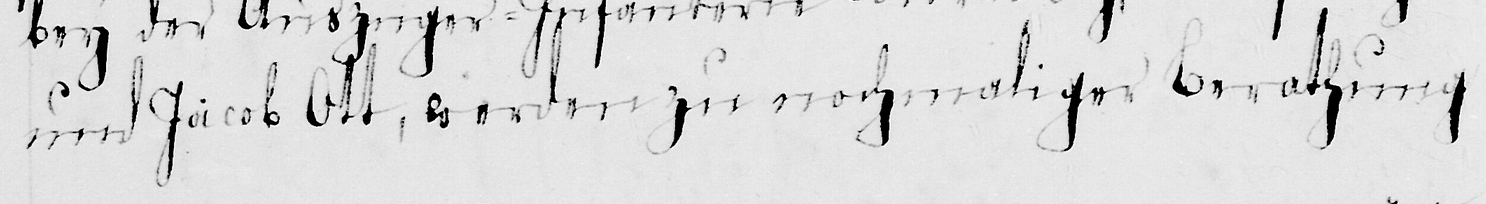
und Jacob Ott, werden zu nochmaliger Berathung
